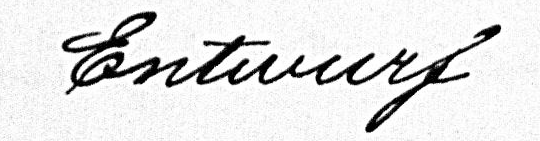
Entwurf
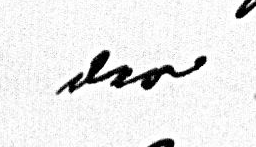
der
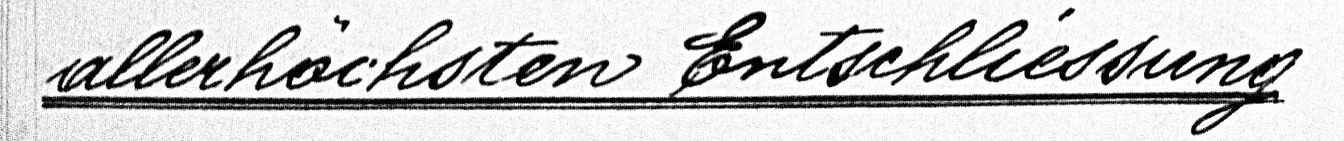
allerhöchsten Entschliessung
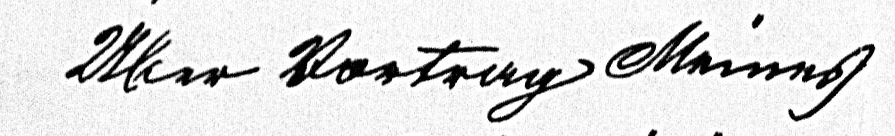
Über Vortrag Meines
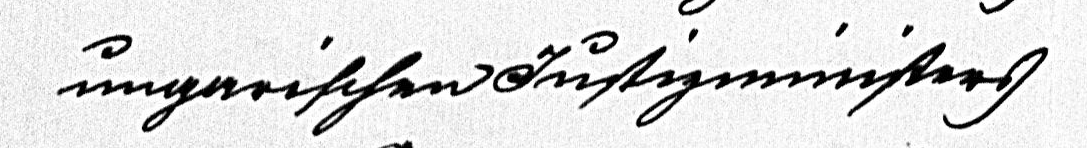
ungarischen Justizministers
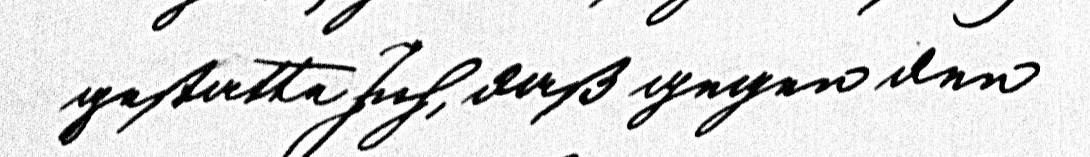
gestatte Inh, daß gegen den
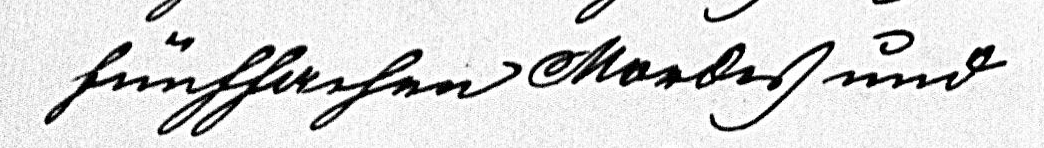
fünffachen Mordes und
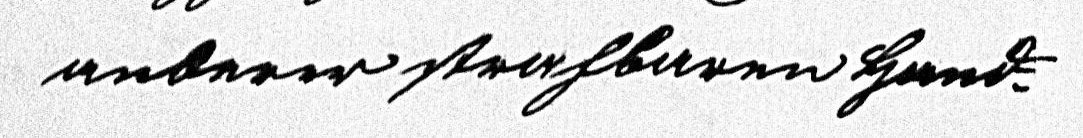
anderer strafbaren Hand¬
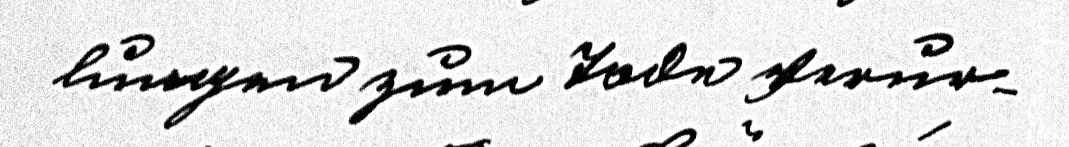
lungen zum Tode verur¬
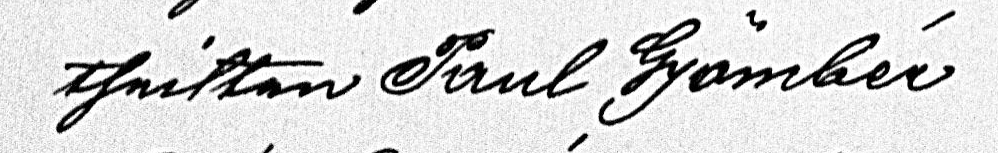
theilten Paul Gyömbér
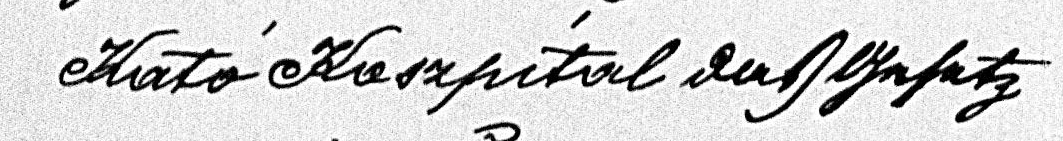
Kató Koszpital daß Gesetz
